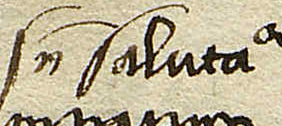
ſ*n ſaluta*
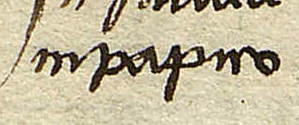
in papiro
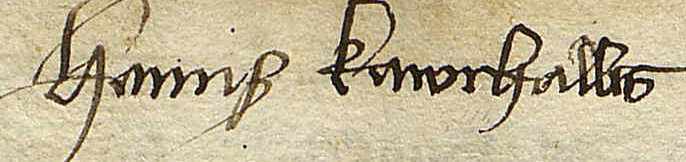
Hannſ* kawrhalls
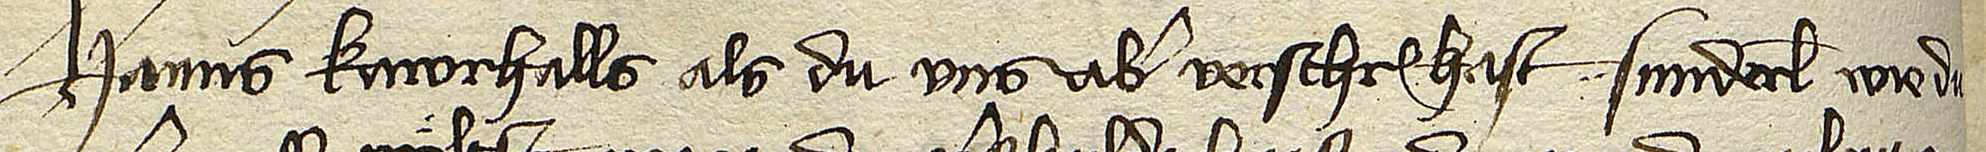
Hanns kawrhalls als du vns ab* verſchr* haſt . ſunderl* wie du
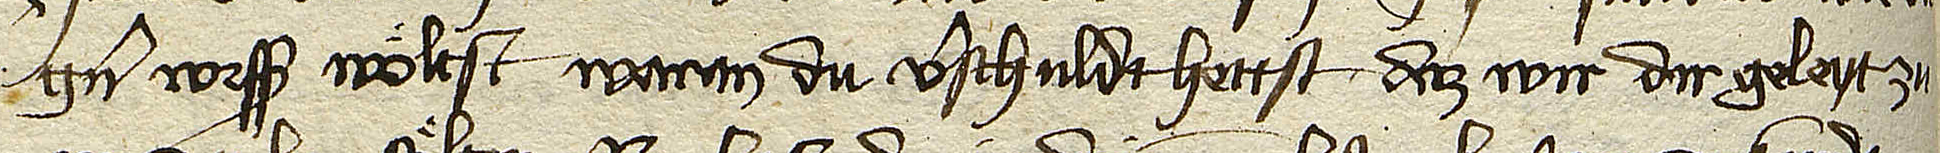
g*n wiſſ* wöltſt waran du v*ſchuldt hettſt / daʒ wir dir geleyt ʒu
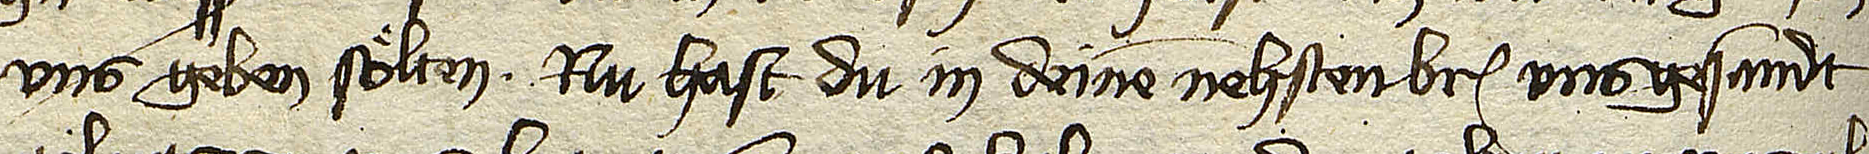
vns geben ſölten . Nu haſt du in deine* nehſten b*r vns geſandt
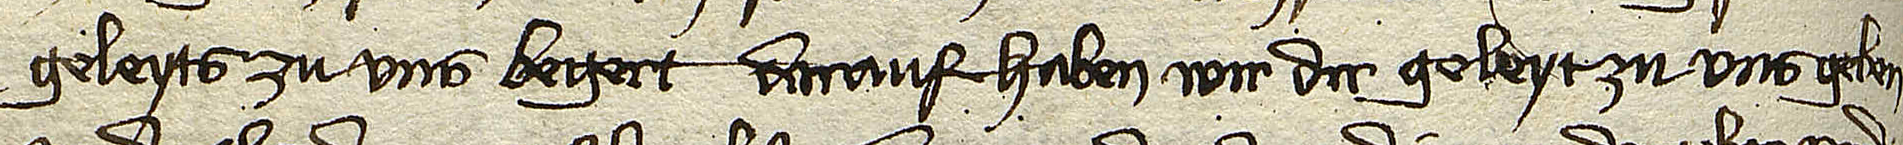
geleyts ʒu vns begert darauf haben wir dir geleyt ʒu vns geben
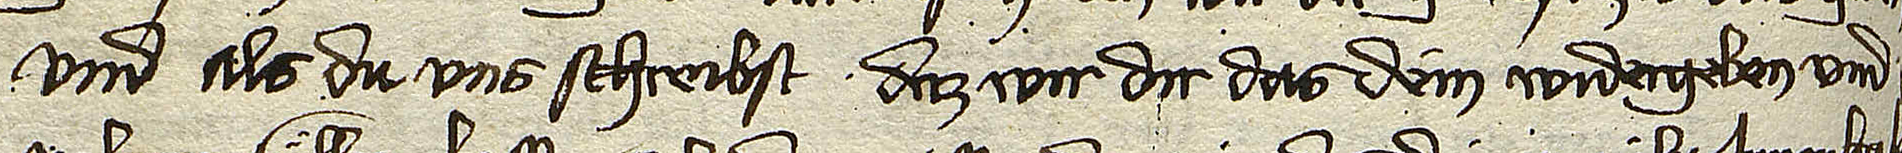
vnd als du vns ſchreibſt . daʒ wir dir das dein widergeben vnd
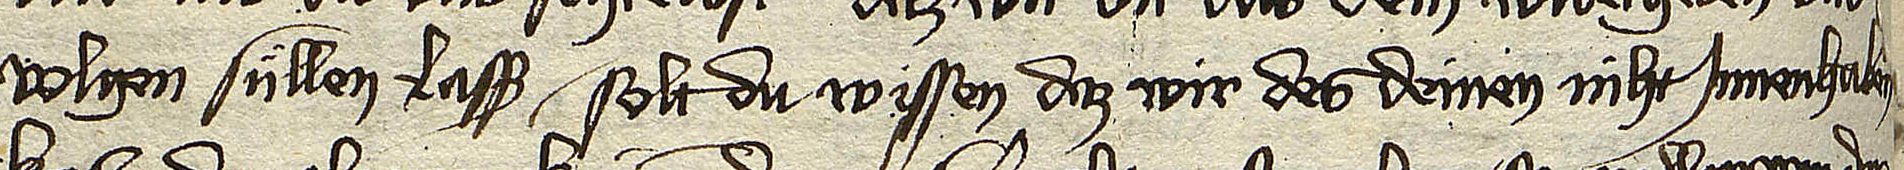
volgen ſüllen laſſ* / ſolt du wiſſen daʒ wir des deinen niht Innenhaben
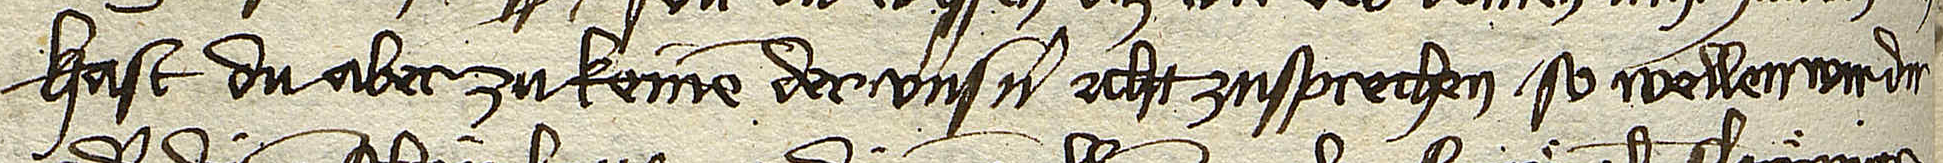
haſt du aber ʒu keine* der vnſ*n icht ʒuſprechen / ſo wellen wir dir
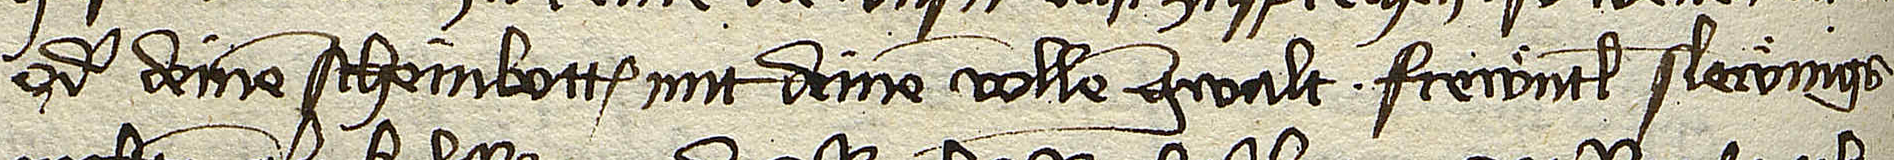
od* deine* ſcheinbott* mit deine* volle* gwalt . freẅntl* ſleẅnigs
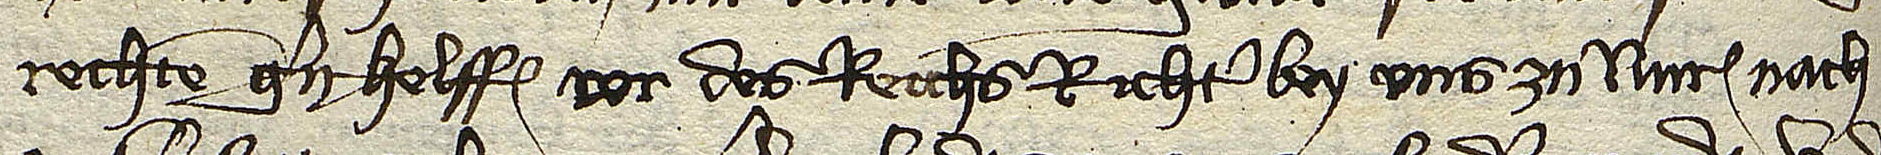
rechte* g*n helff* vor des Reichs Richt* bey vns ʒu Nur* nach
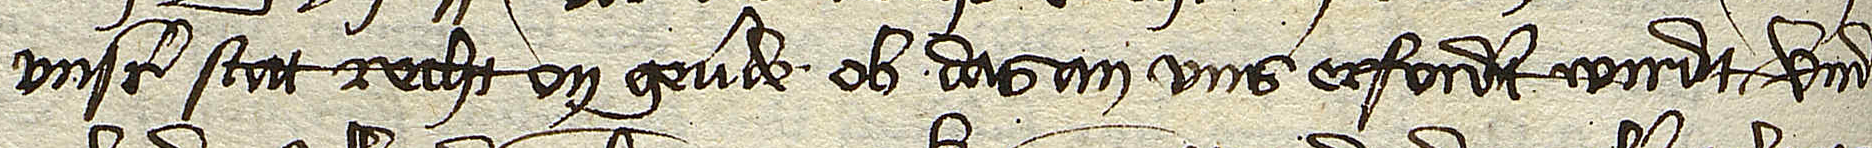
vnſ*r ſtat recht on geu*de . ob das an vns erford*t wirdt / Vnd
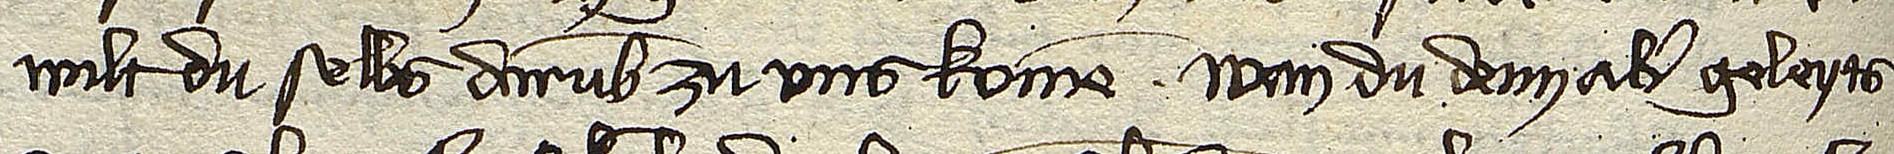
wilt du ſelbs darub* ʒu vns kome* . Wan du denn ab* geleyts
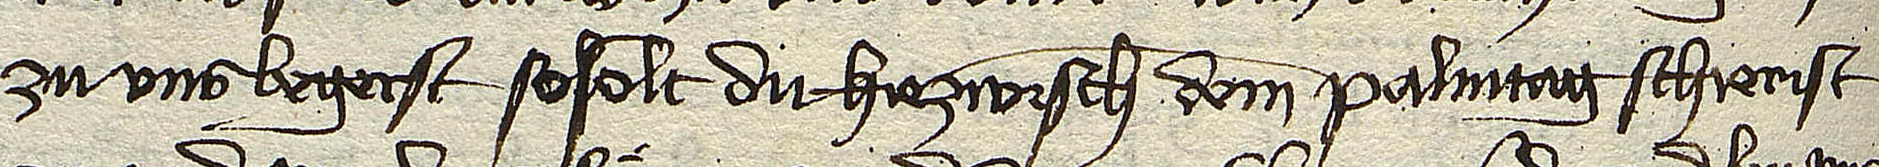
ʒu vns begerſt ſo ſolt du hieʒwiſch* dem palmtag ſchieriſt
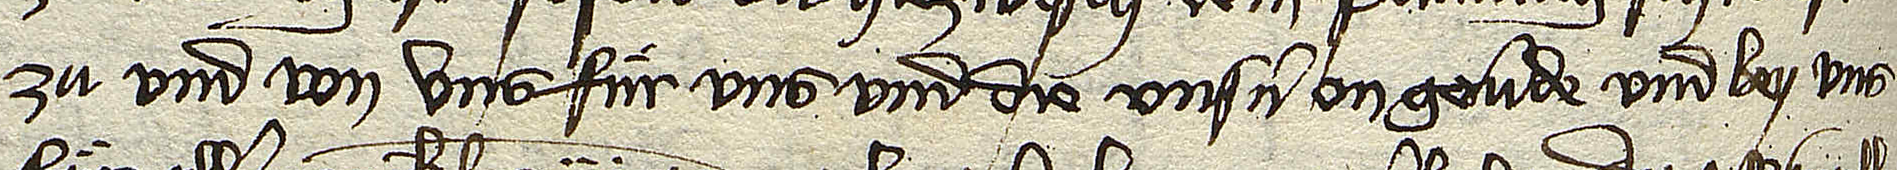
ʒu vnd von vns für vns vnd die vnſ*n on geu*de vnd bey vns
